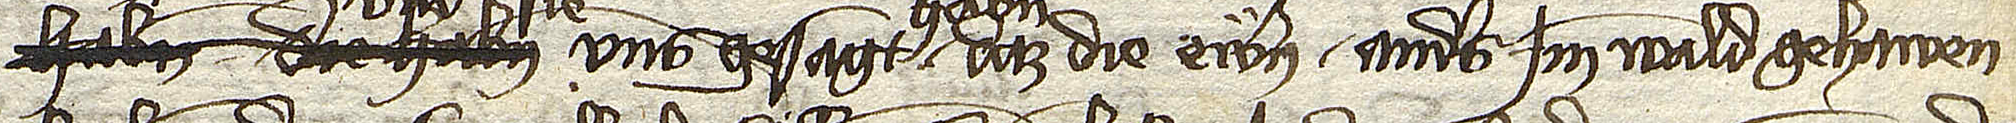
habn* / Die habn* vns geſagt / daʒ die eẅ*n / and*s Im* wald gehawen
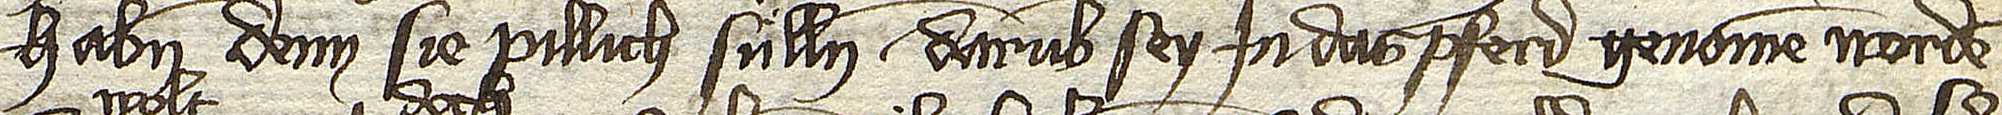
habn* Denn ſie pillich ſülln* / darub* ſey In das pferd genome* worde*
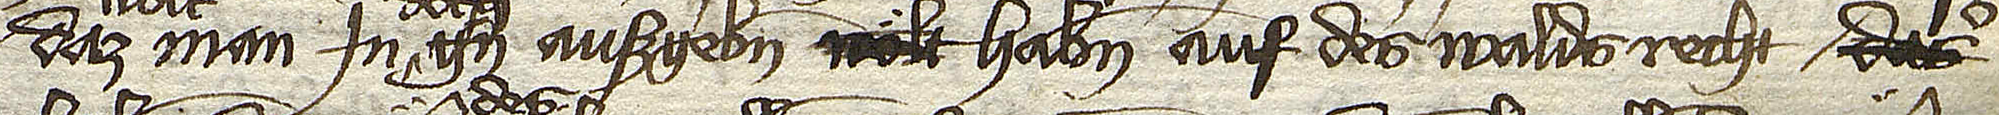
/ daʒ man In g*n auſʒgebn* wölt habn* auf des walds recht / Das
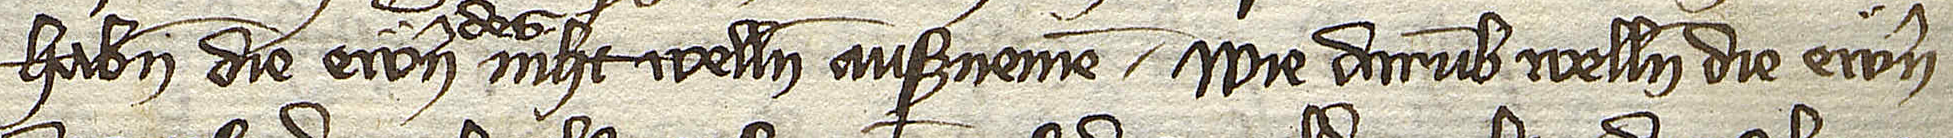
habn* die eẅ*n niht welln* auſʒneme* / Wie darub* welln* die eẅ*n
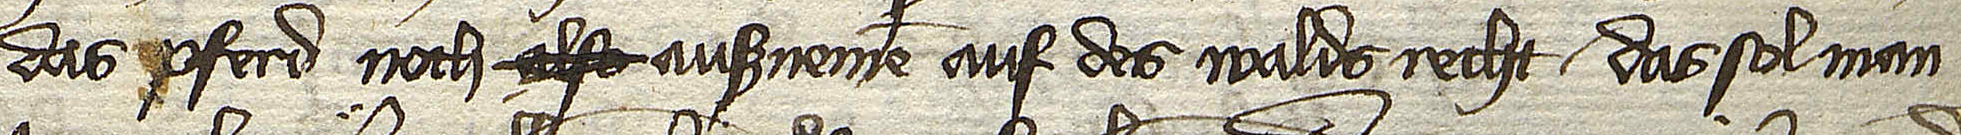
das pferd noch alſo auſʒneme* auf des walds recht / das ſol man
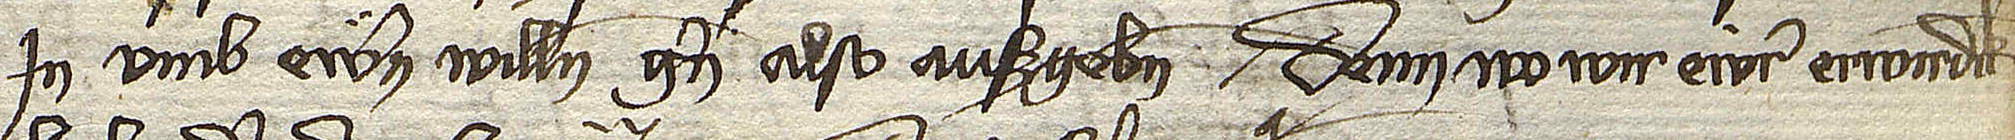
In vmb eẅ*n willn* g*n alſo auſʒgebn* / Denn wo wir eẅr* erwirdik*
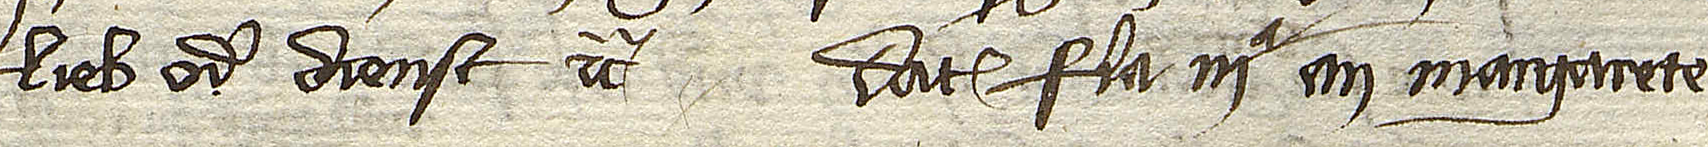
lieb od* dienſt ec* Dat* fi*a iii* an* margarete
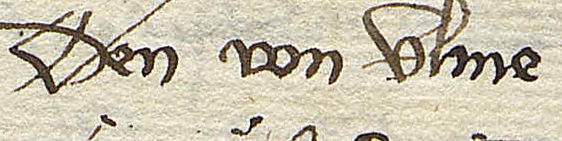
Den von Vlme
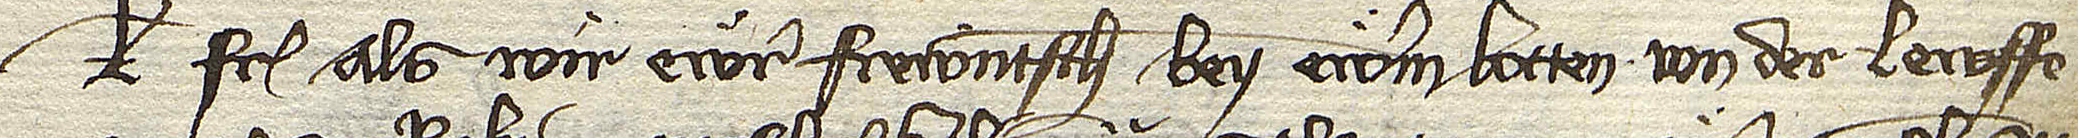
L* fr* / als wir eẅr* freẅntſch* / bey eẅ*m botten . von der lewffe
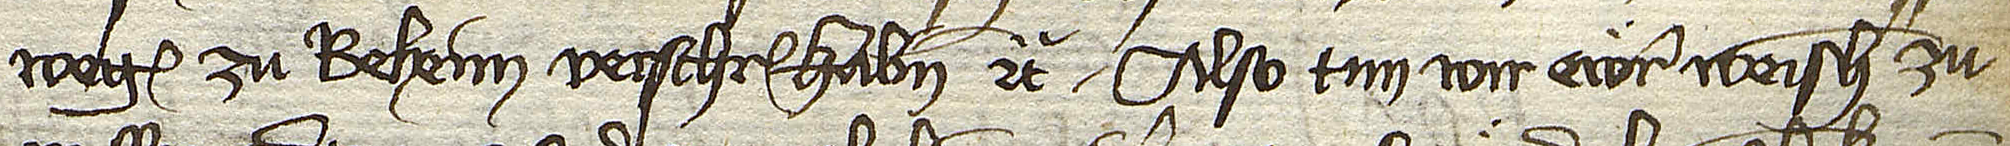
weg* ʒu Beheim verſchr* habn* ec* / Alſo tun wir eẅr* weiſh* ʒu
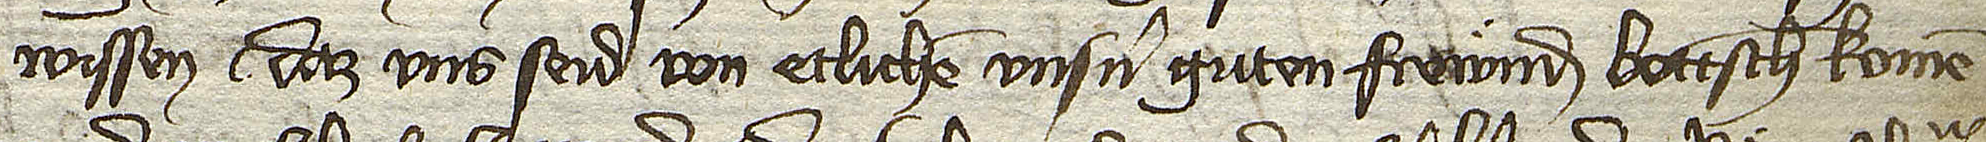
wiſſen / Daʒ vns ſeid von etliche* vnſn* guten freẅnd* bottſch* kome*
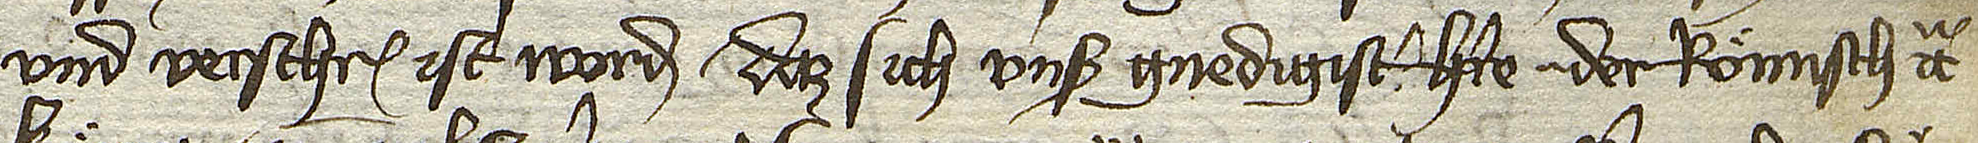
vnd verſchr* iſt word* / Daʒ ſich vnſ* gnedigiſt* h*re ~ der Römiſch ec*
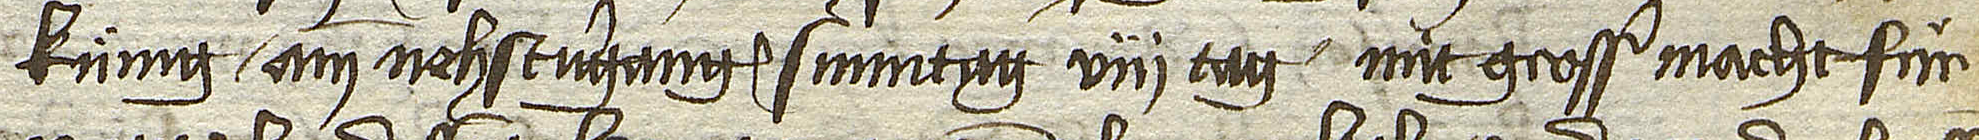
künig / am* nehſtu*gang* ſunntag viii tag / mit groſſ* macht für
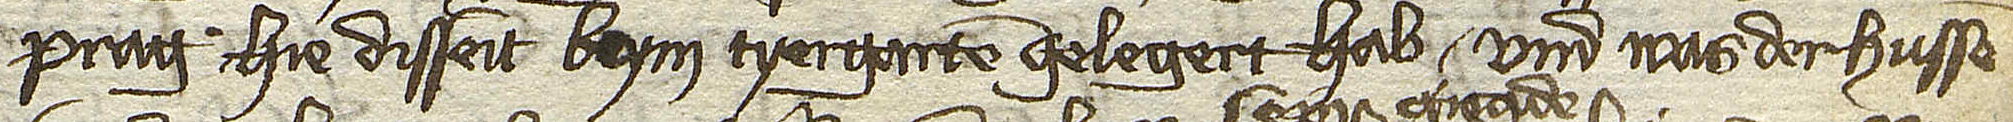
Prag hie diſſeit beym tyergarte* gelegert hab / vnd was der huſſe*
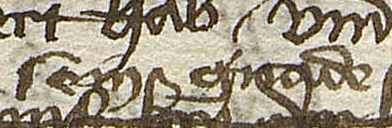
ſein gnade
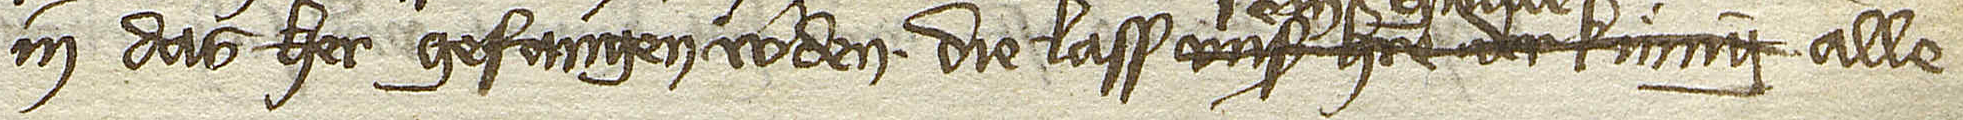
in das her gefangen w*den . die laſſ vnſ* h*re ~ der künig alle
